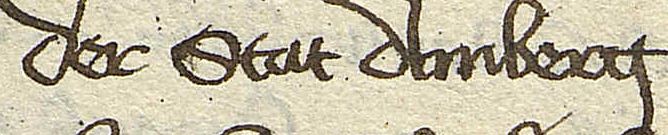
der Stat Amberg
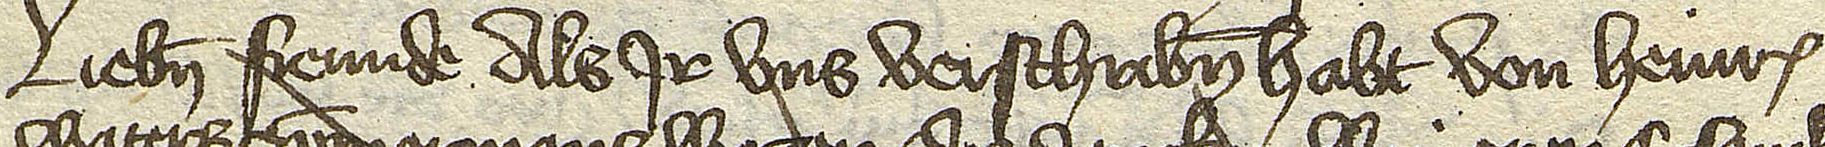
Liebn* freunde Als Ir vns verſchribn* habt von heinr*
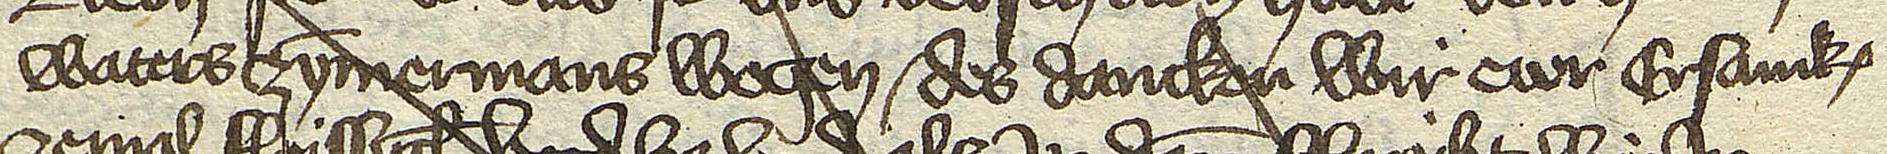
waters cʒymermans wegen / des dancken wir ewr Erſamk*
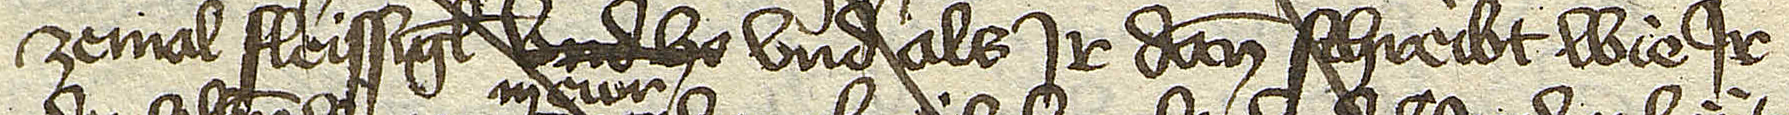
cʒemal fleiſſigl* vnd* h* vnd als Ir dan* ſchreibt wie Ir
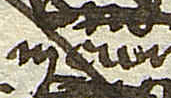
in ewr
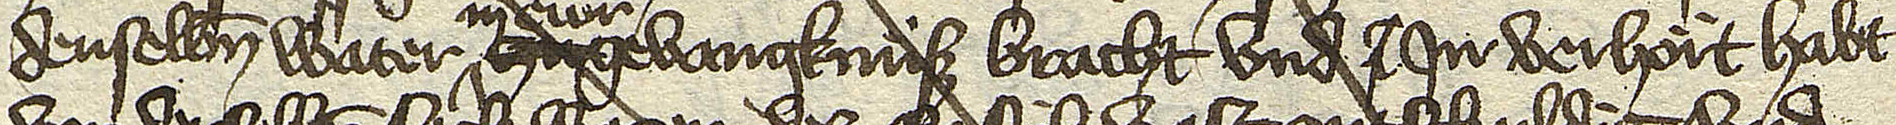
denſelbn* water cʒugevangknüſʒ bracht vnd % In verhört habt
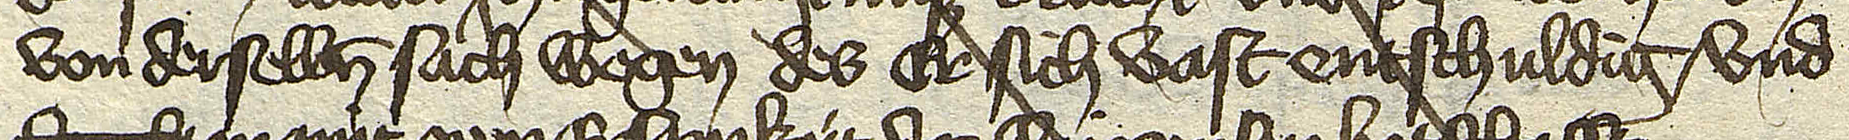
von derſelbn* ſach wegen des Er ſich vaſt entſchuldig / vnd
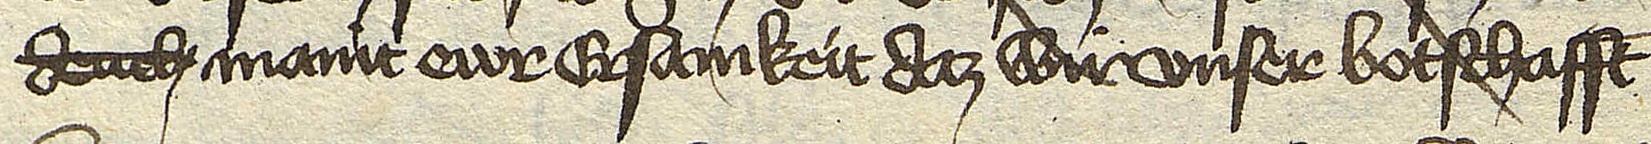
deuch maint ewr Erſamkeit daʒ wir vnſer botſchafft
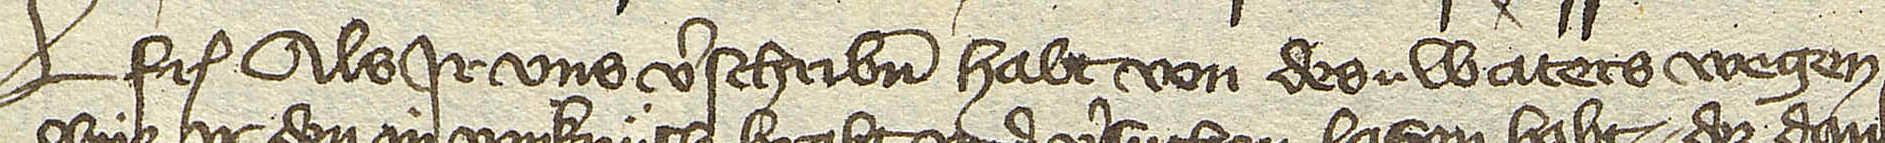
L* fr* Als Ir vns v*ſchribn* habt von des ~ waters wegen
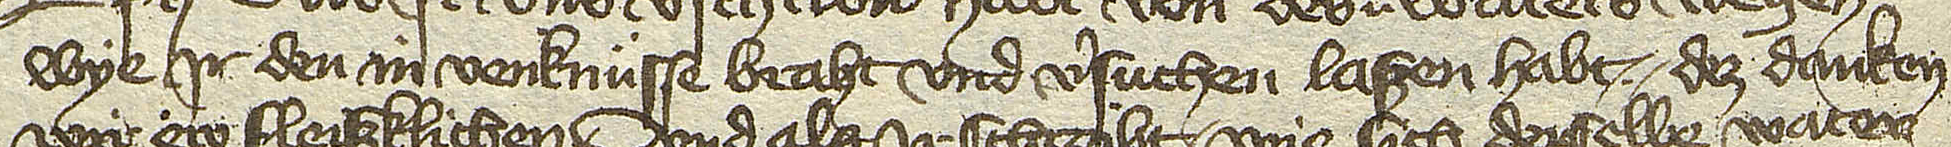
wye Ir den in venknüſſe braht vnd v*ſuchen laſʒen habt / deʒ danken
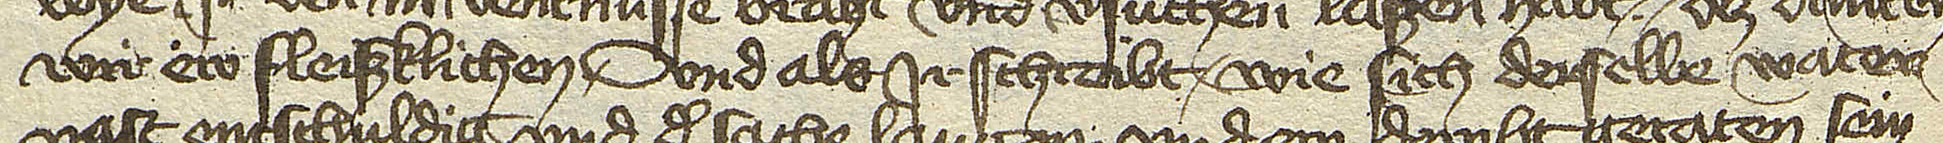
wir ew fleiſʒklichen / Vnd als Ir ſchreibt / wie ſich derſelbe water
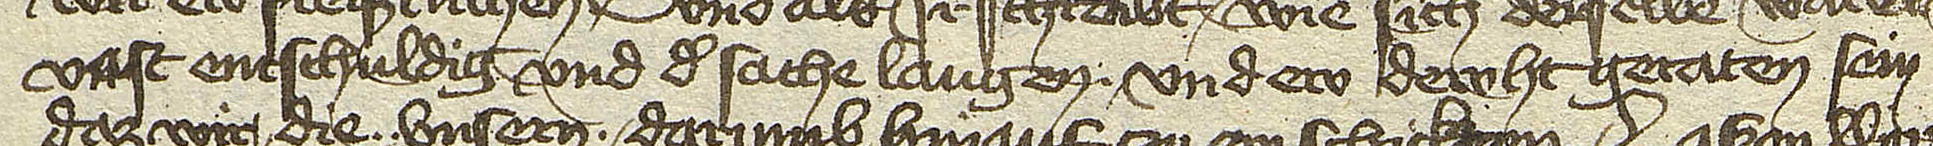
vaſt entſchuldig vnd d* ſache laugen . vnd ew dewht geraten ſein
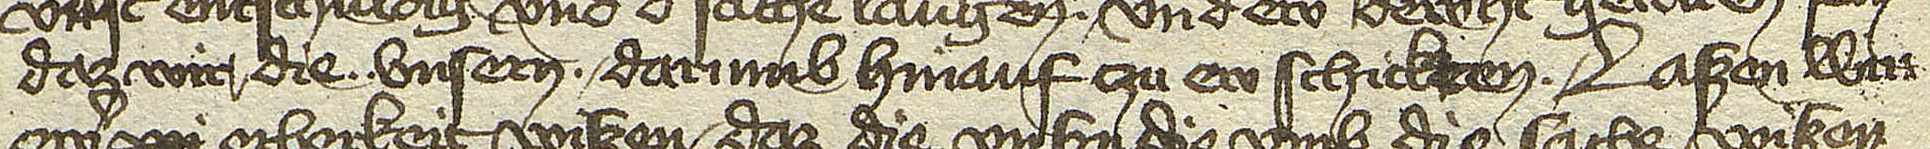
daʒ wir die ~ vnſern . / darumb hinauf cʒu ew ſchicken . / Laſʒen wir
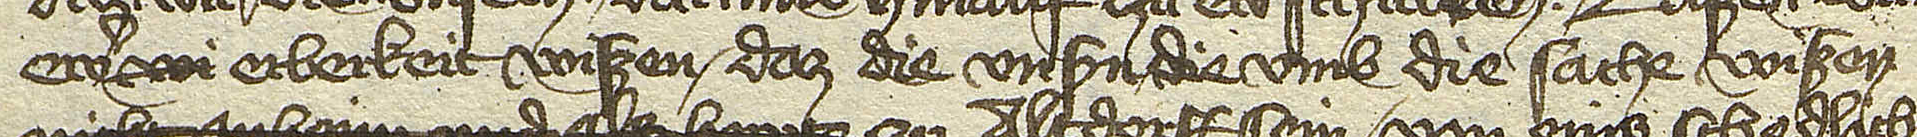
ew* wi erberkeit wiſʒen / daʒ die vnſ*n die vmb die ſache wiſʒen
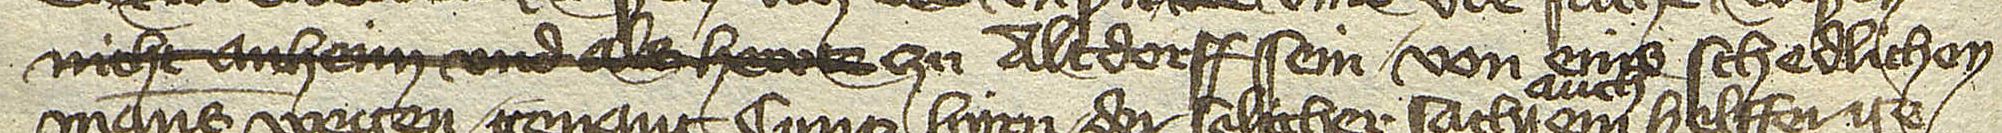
nicht anheim vnd als hewte cʒu Altdorff ſein / von eins ſchedlichen
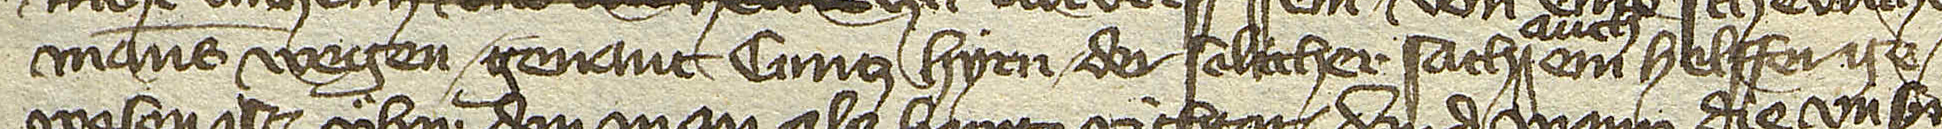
mans wegen / genant Cuncʒ hyrn / der ſolicher ſach ein helffer ge
